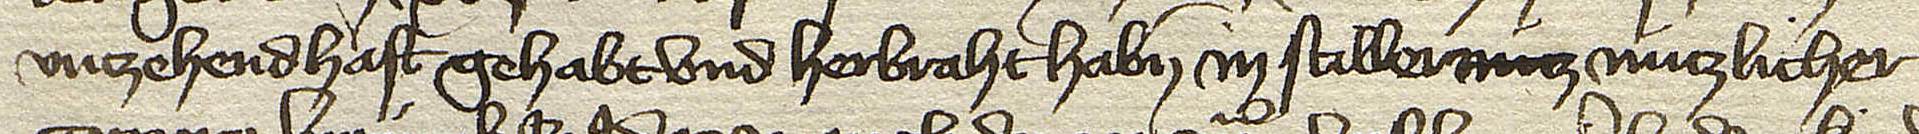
vncʒehendhaft gehabt vnd herbraht habn* in ſtillernücʒ nücʒlicher
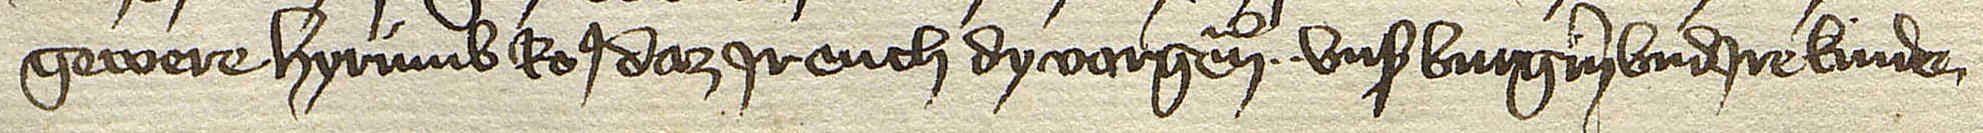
gewere hyrümb Ro* Daʒ Ir euch dy vorgen* ~ vnſ* burg*in vnd Ire kinden
